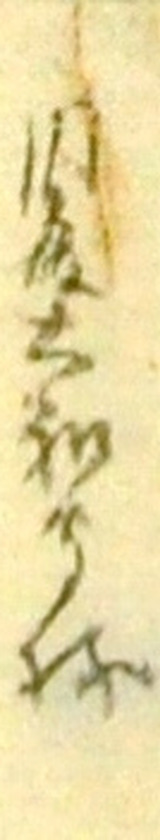内藤大和守様

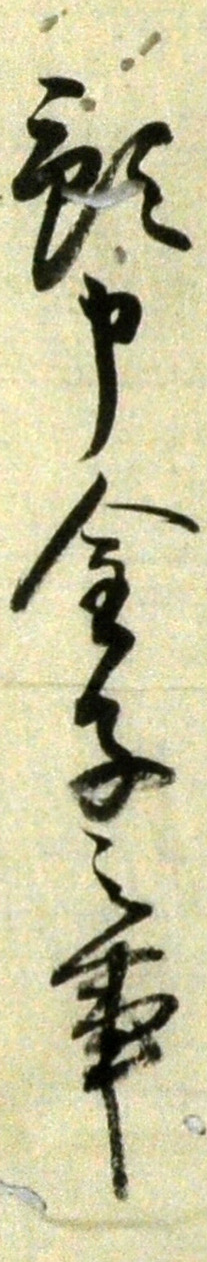預申金子之事
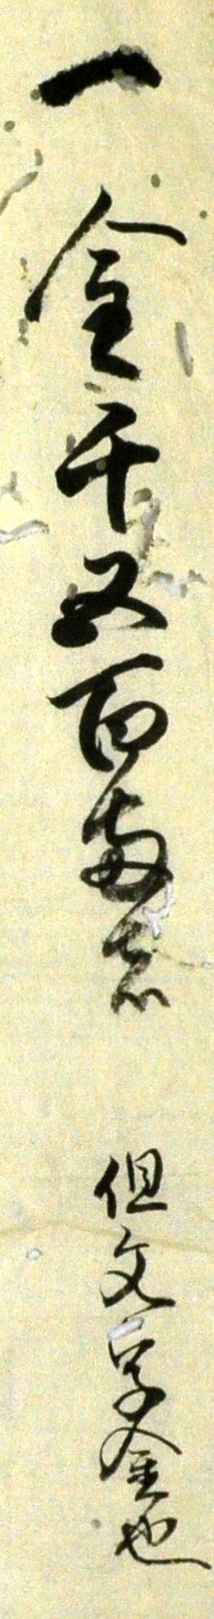一金千五百両者但文字金也
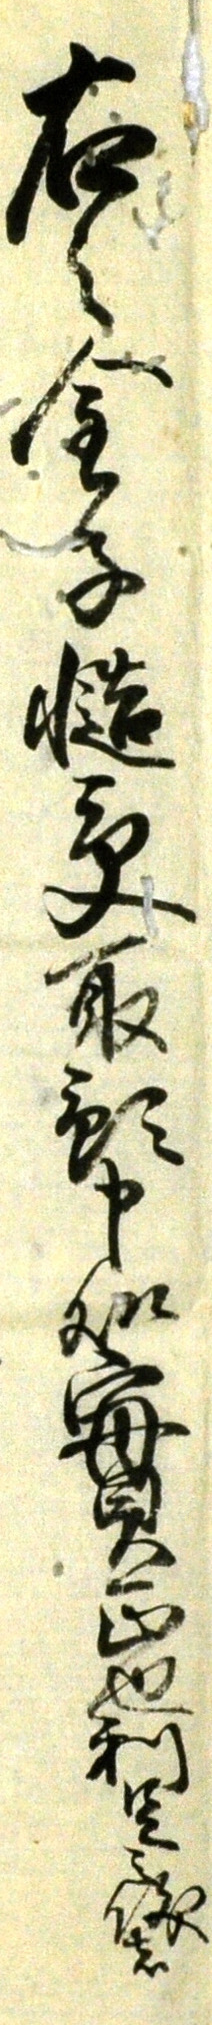右之金子慥受取預申処実正也利足之儀者
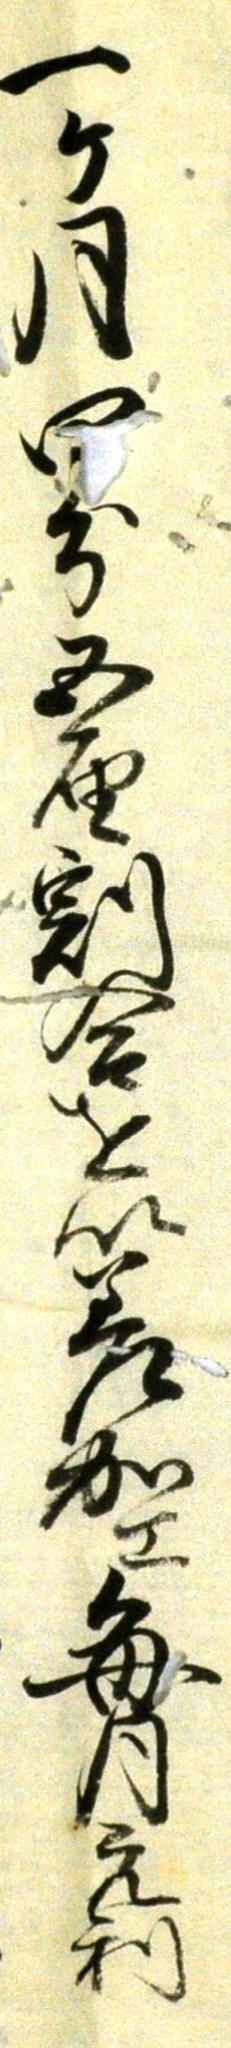一ヶ月四分五厘割合を以差加エ毎月元利
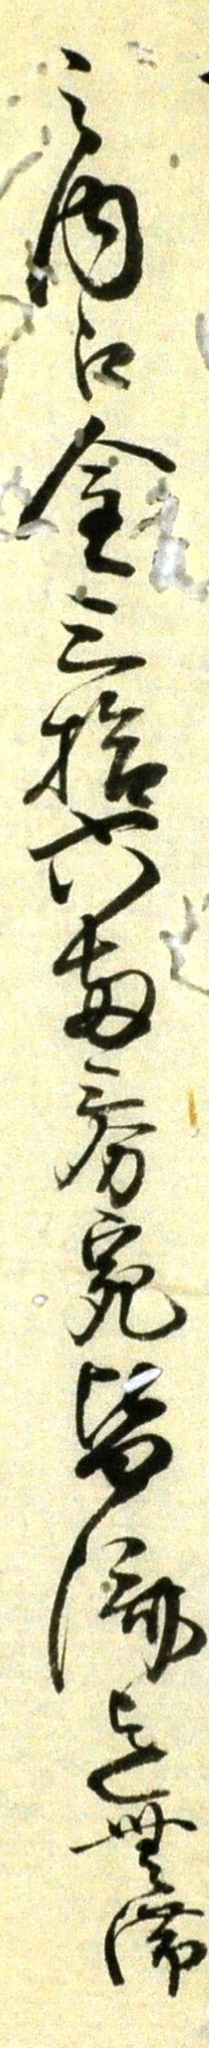之内江金三拾六両三分宛皆済迄無滞
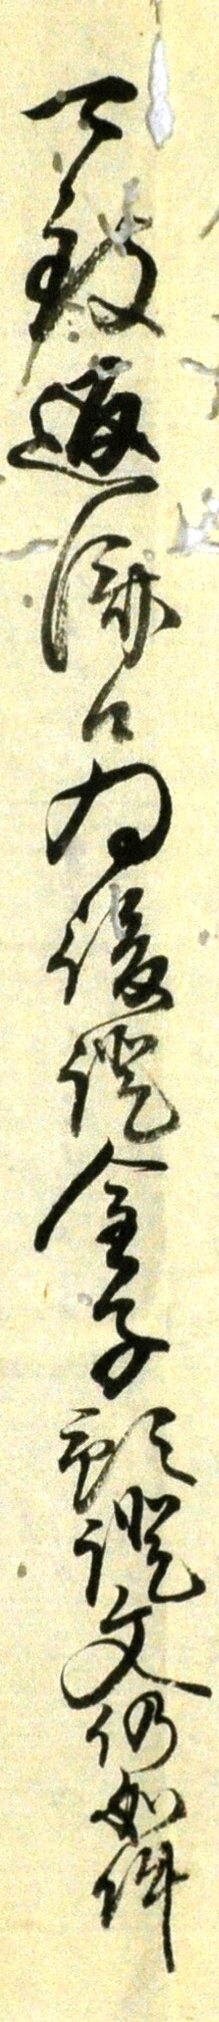可致返済候為後証金子預証文仍如件
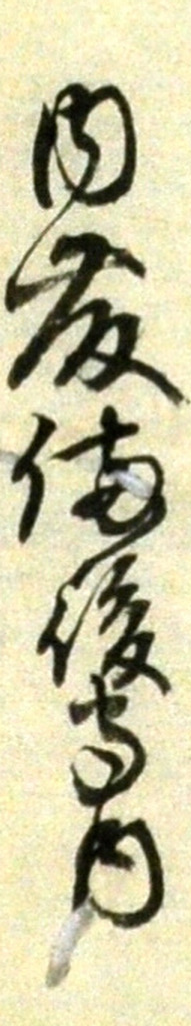内藤備後守内
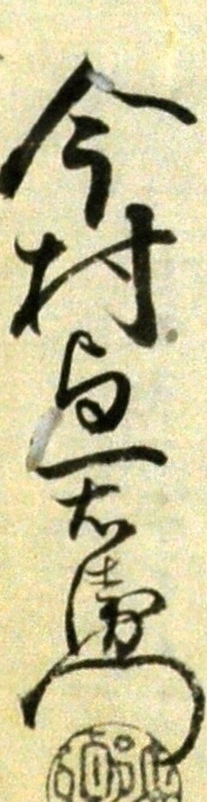今村与一右衛門㊞
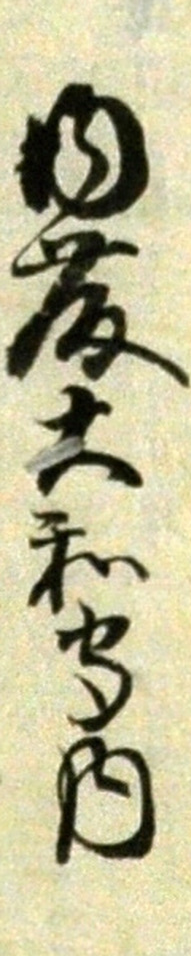内藤大和守内
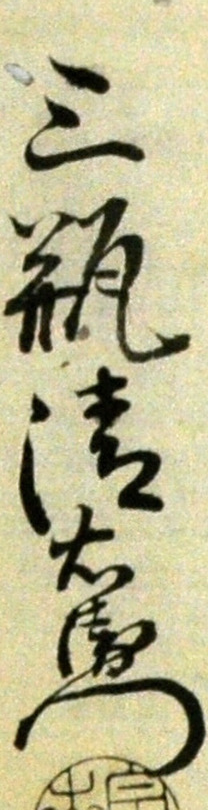三瓶清右衛門㊞

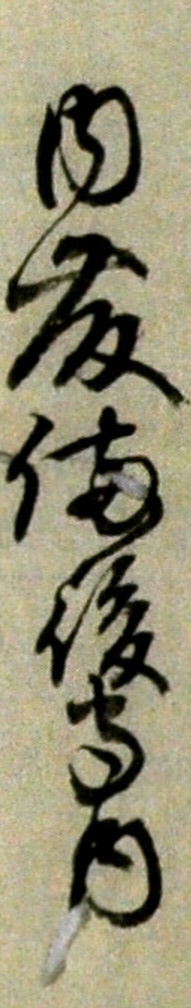内藤備後守内
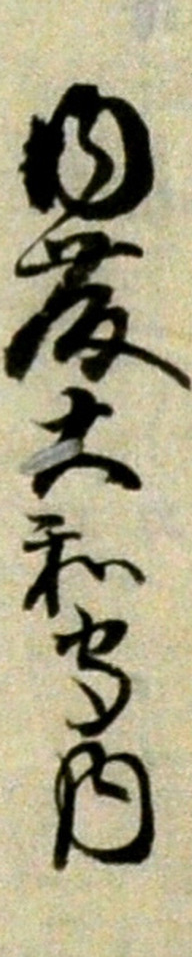内藤備後守内
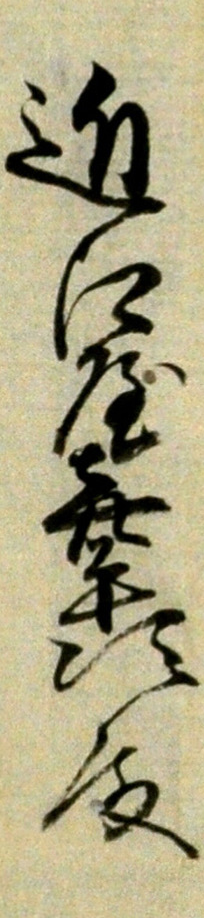近江屋喜平治殿
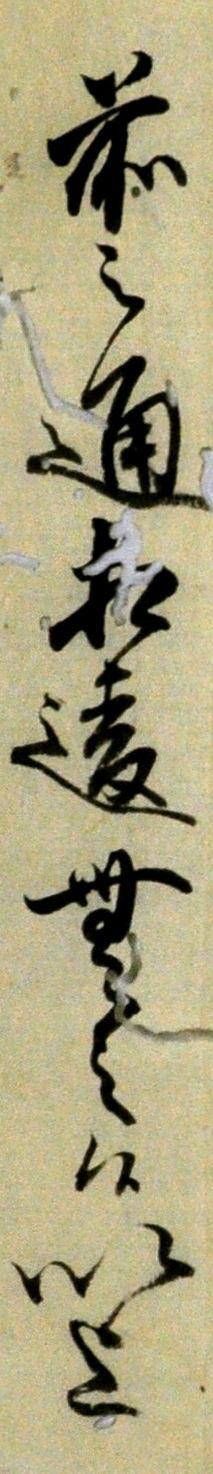前之通相違無之候以上
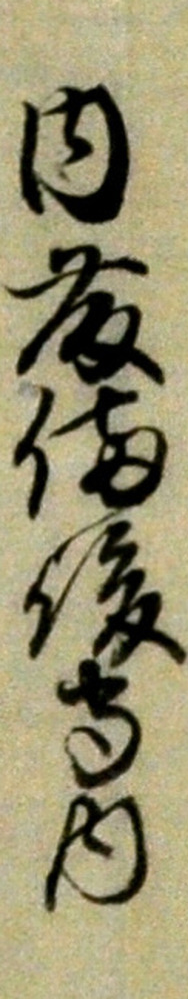内藤備後守内
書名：預り申金子之事
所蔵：伊那市立高遠町図書館・合同会社AMANE
